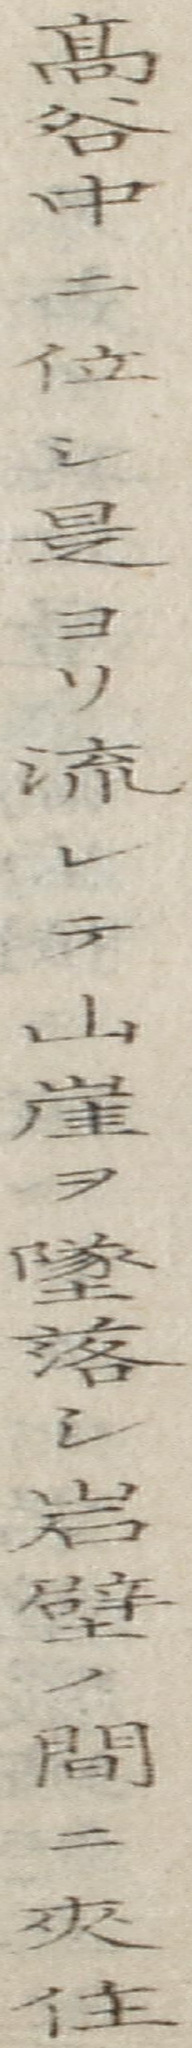高谷中ニ位シ是ヨリ流レテ山崖ヲ墜落シ岩盤ノ間ニ夾住
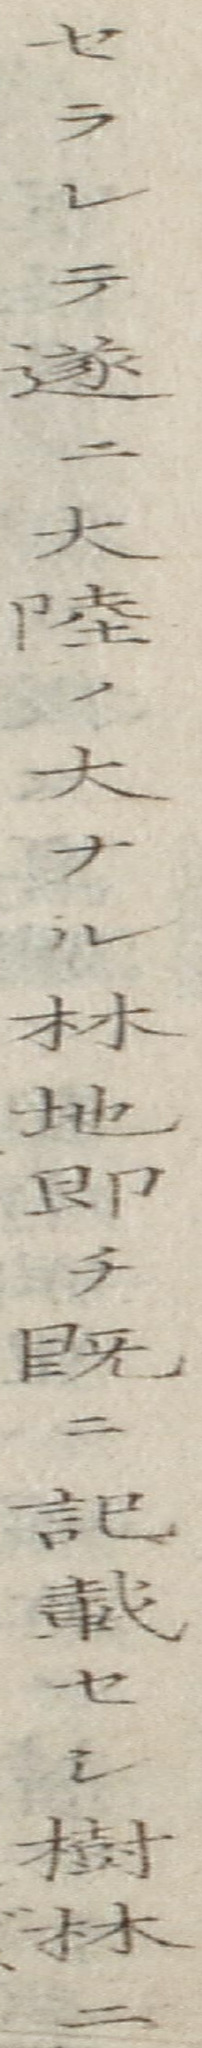セラレテ遂ニ大陸ノ大ナル林地即チ既ニ記載セシ樹林ニ
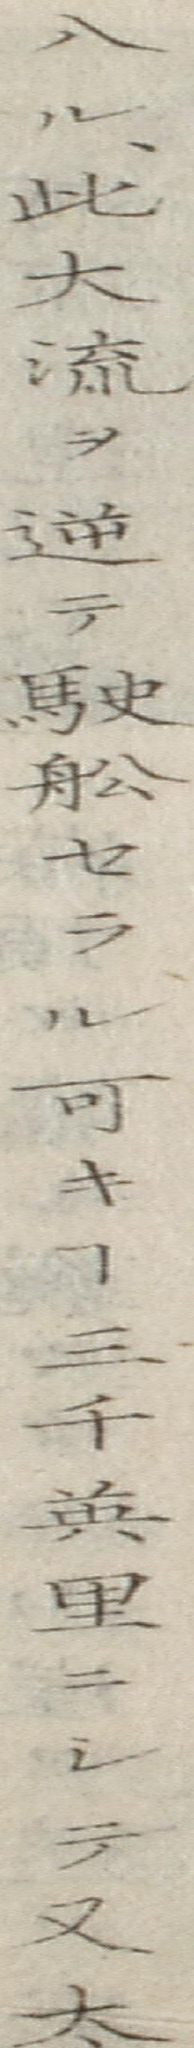入ル、此大流ヲ逆テ駛舩セラル可キヿ三千英里ニシテ又太
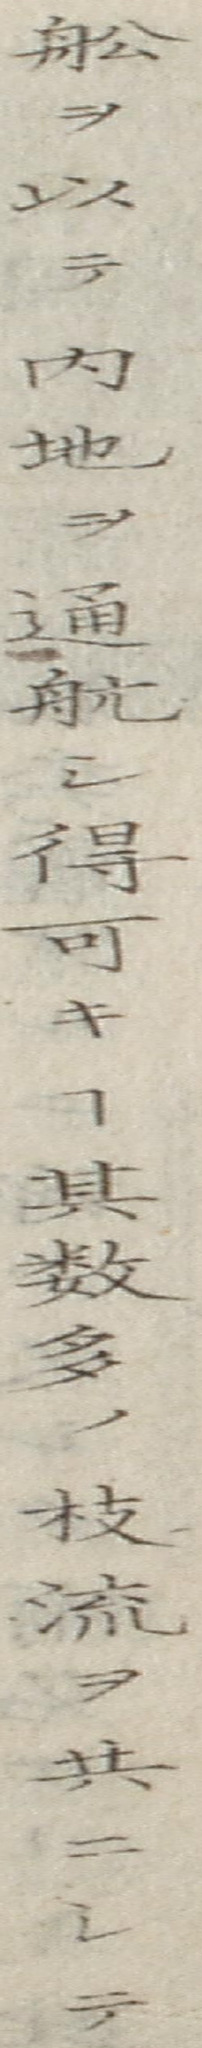舩ヲ以テ内地ヲ通舩シ得可キヿ其数多ノ枝流ヲ共ニシテ
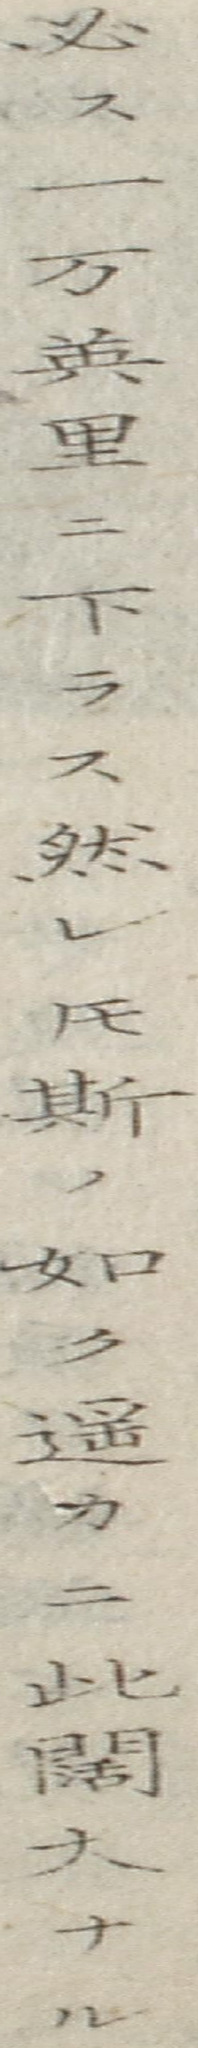必ス一万英里ニ下ラス然レトモ斯ノ如ク遙カニ此闊大ナル
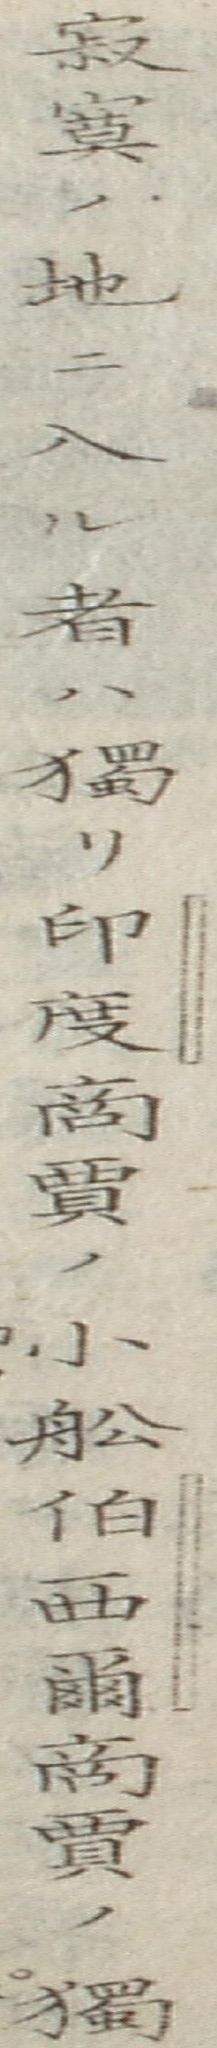寂寞ハ地ニ入ル者ハ独リ印度商買ノ小舩伯西爾商買ノ独
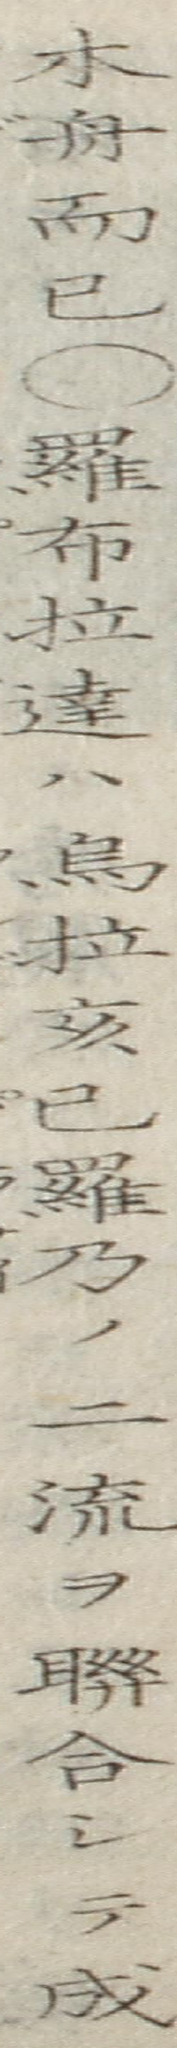木舟而已○羅布拉達ハ烏拉亥已羅乃ノ二流ヲ総合シテ成
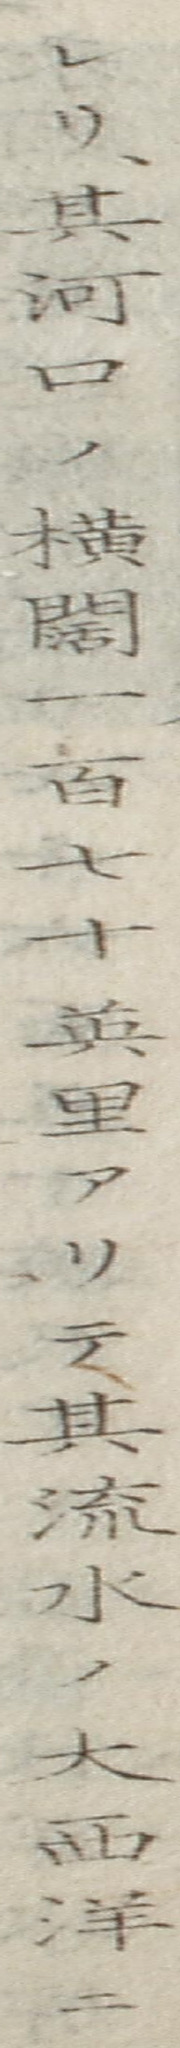レリ、其河口ノ横闊一百七十英里アリテ其流水ノ大西洋ニ
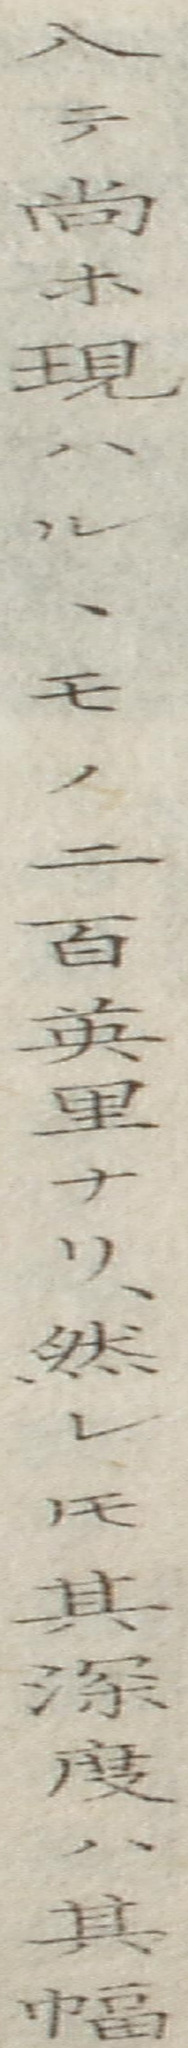入テ尚ホ現ハルヽモノ二百英里ナリ、然レトモ其深度ハ其幅
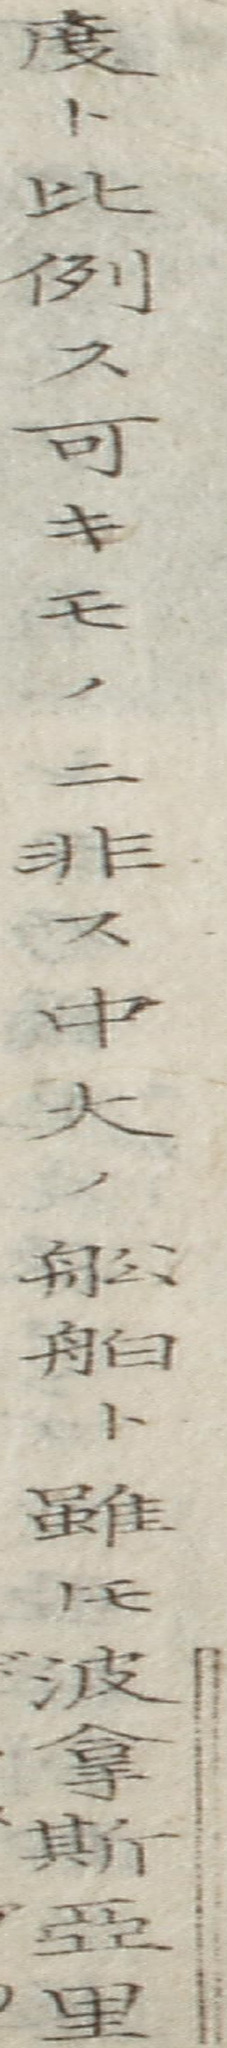度ト比例ス可キモノニ非ス中大ノ舩舶ト雖トモ波拿斯亜里
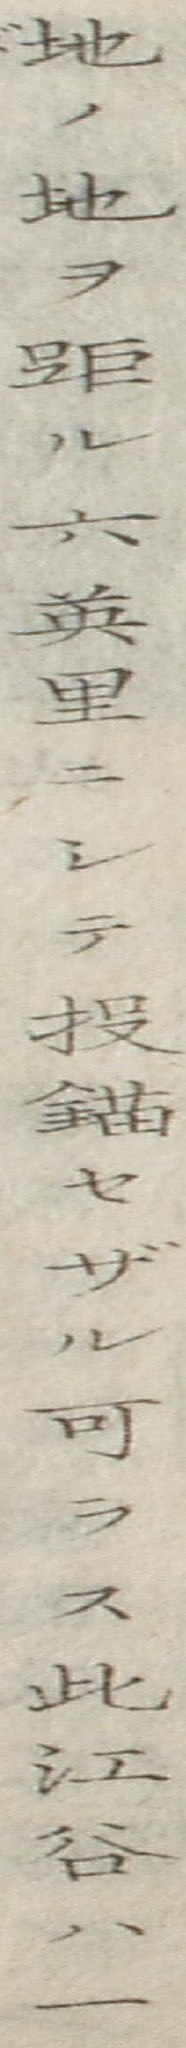地ノ地ヲ距ル六英里ニシテ投錨セザル可ラス此江谷ハ一
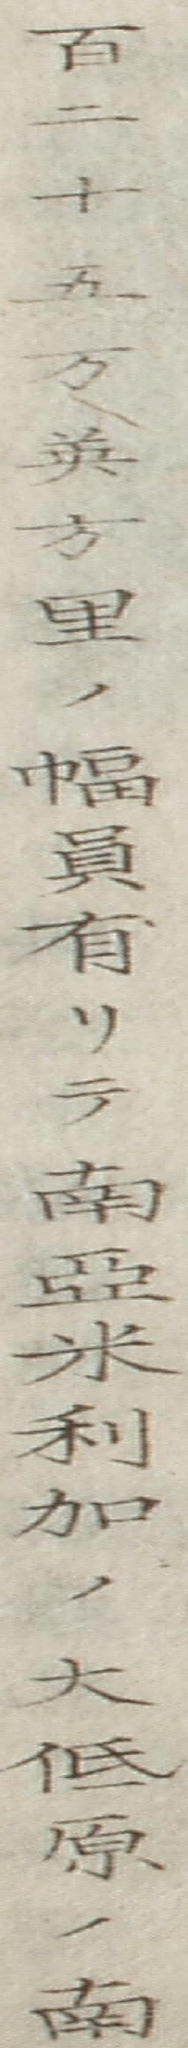百二十五万英方里ノ幅員有リテ南亜米利加ノ大低原ノ南
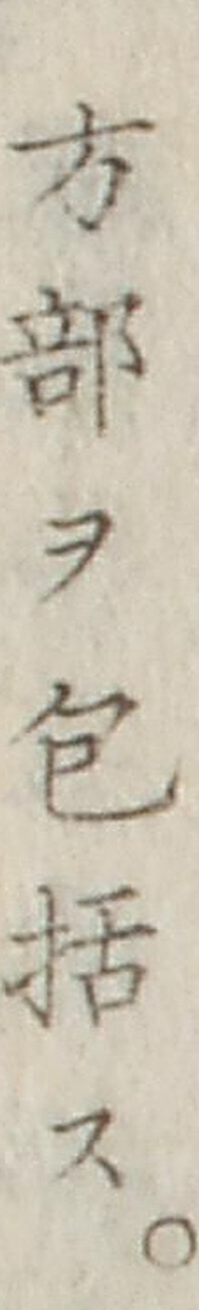方部ヲ包括ス。

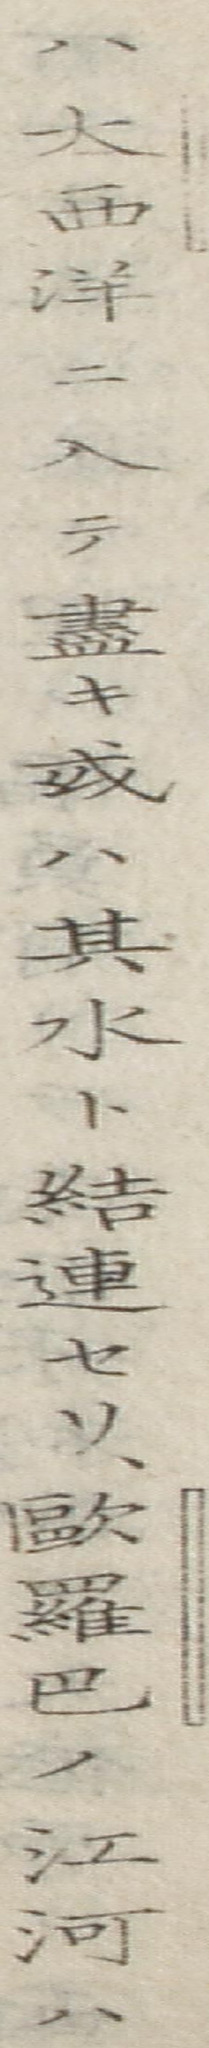ハ大西洋ニ入テ尽或ハ其水ト結連セリ、欧羅巴ノ江河ハ
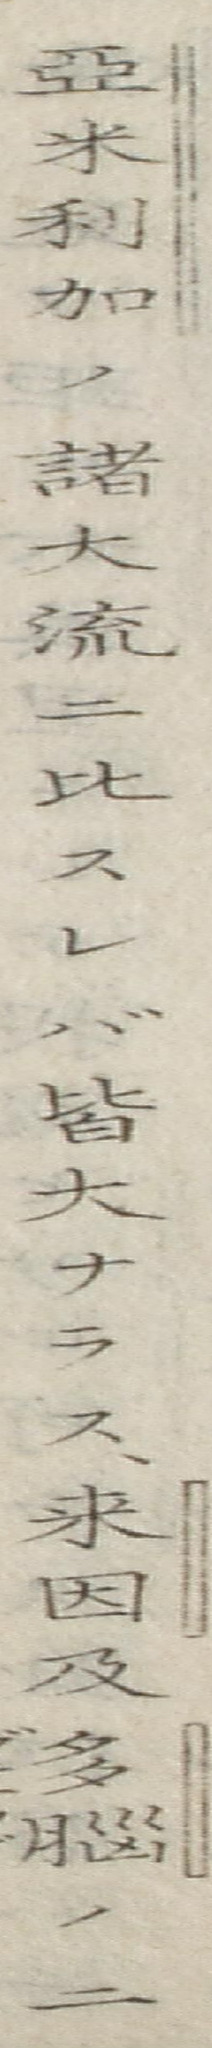亜米利加ノ諸大流ニ比スレバ皆大ナラス、来因及多脳ノ二
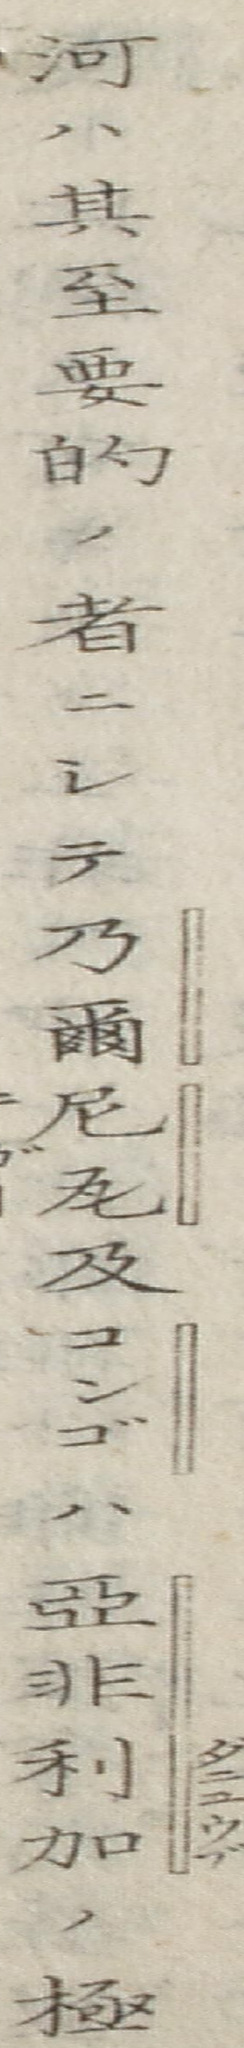河ハ其至要的ノ者ニシテ乃爾尼瓦及コンゴハ亜非利加ノ極
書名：地形論　巻二
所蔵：東京大学地震研究所図書室 Earthquake Research Institute Library, The University of Tokyo, JAPAN
